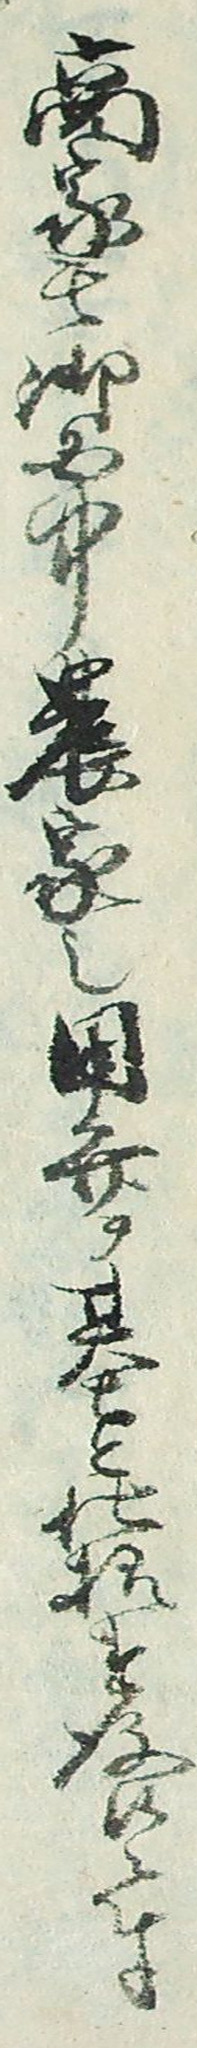商家其御国中農家之用弁を基と仕様奉存候に付

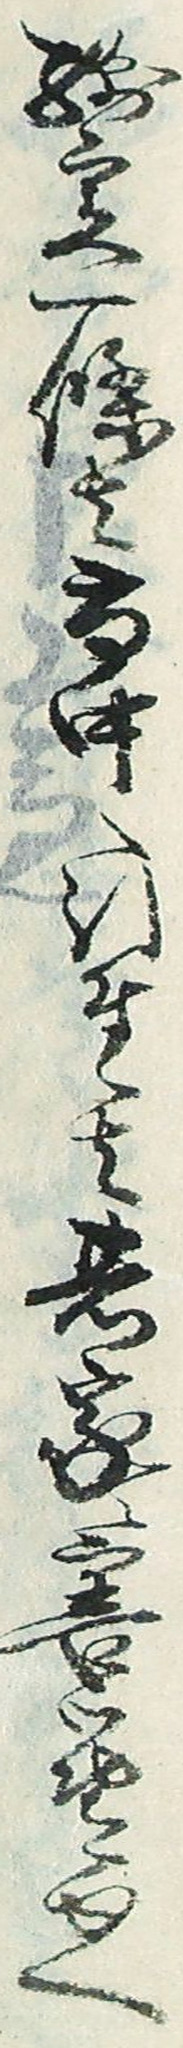綿実一條者市中へ引付候者農家に害御坐候
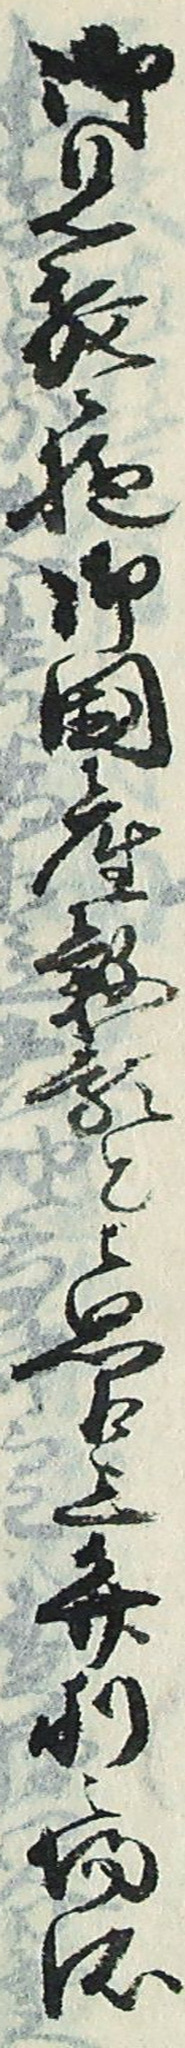御見放被遊御国産穀類と被思召上弁利之場所
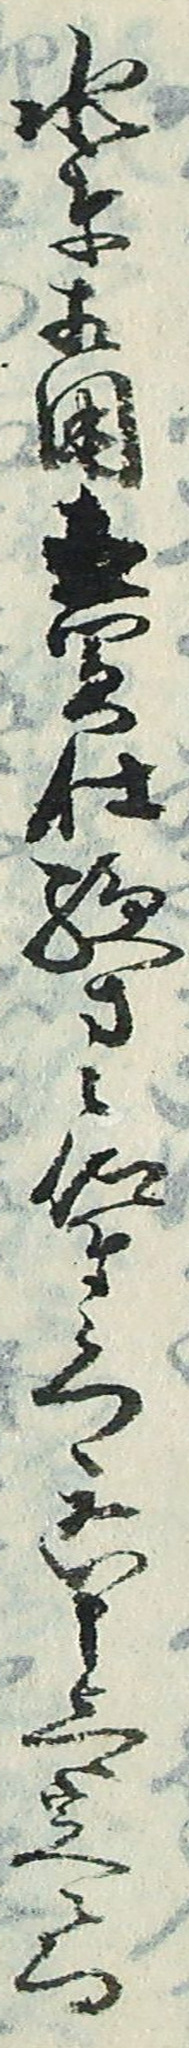水車相用売買仕絞方被仰付候はゝ右申上候定に而
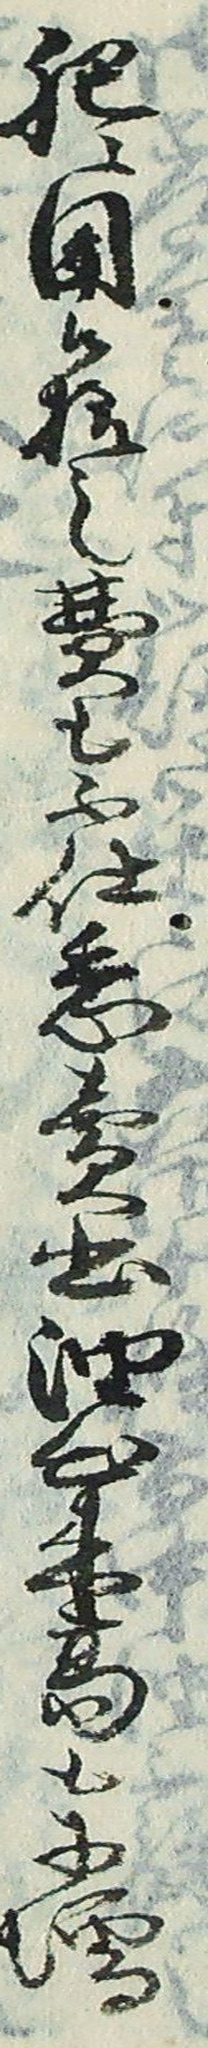肥に用候様之費も不仕悉売出油出来高も相増
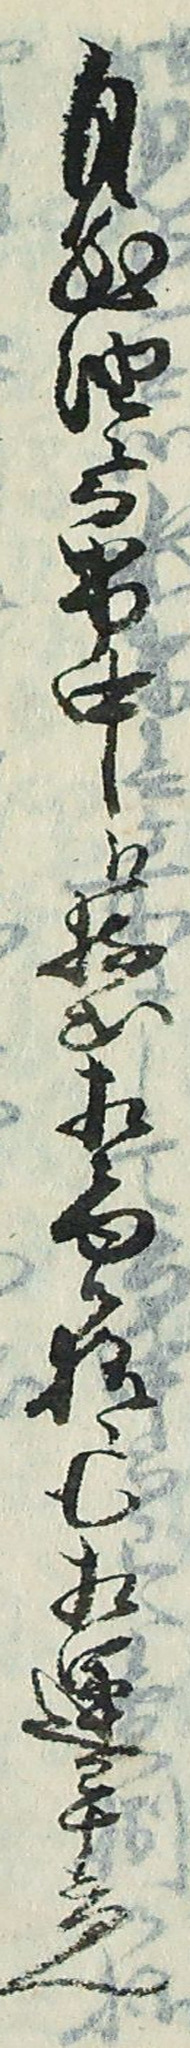自然油に而市中江持出相商候様にも相運畢竟
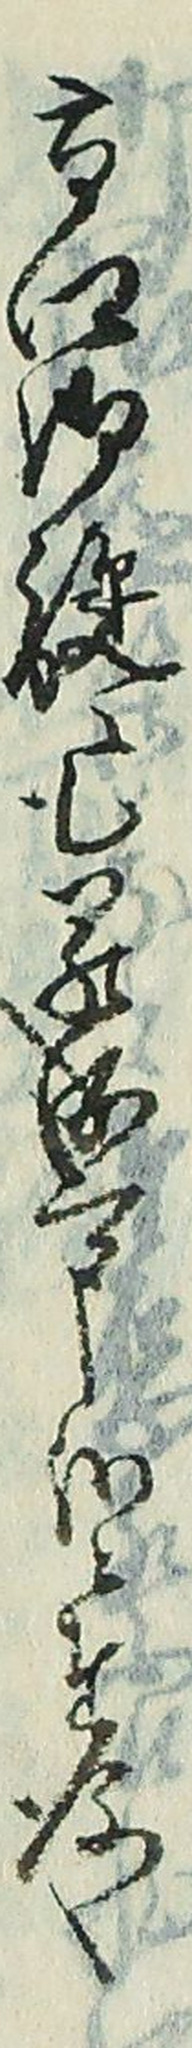市郷御健にも罷成可申哉に奉存候
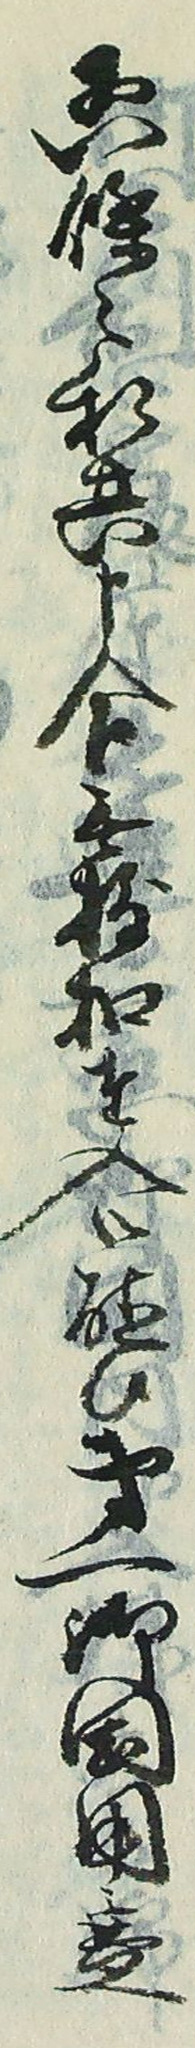右條々私共申合無指扣奉入御聴候第一御国用之費
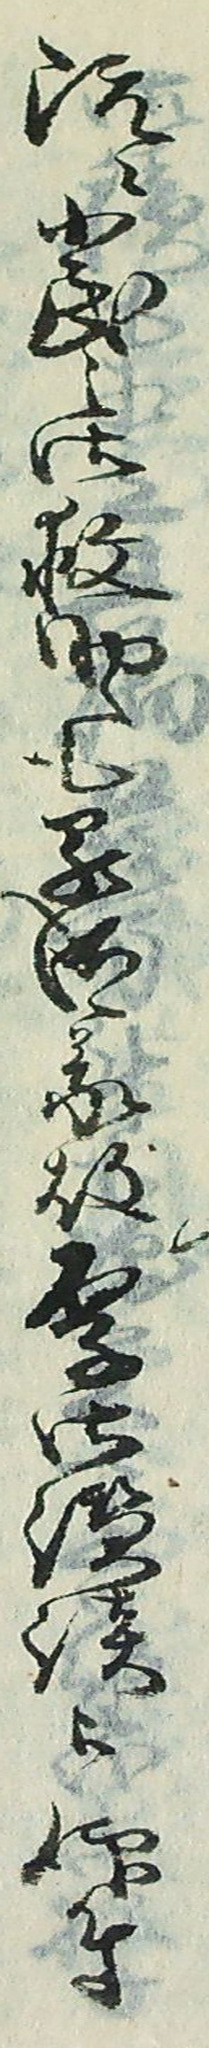既に小民之御救助にも罷成候義故厚御讃談被仰付
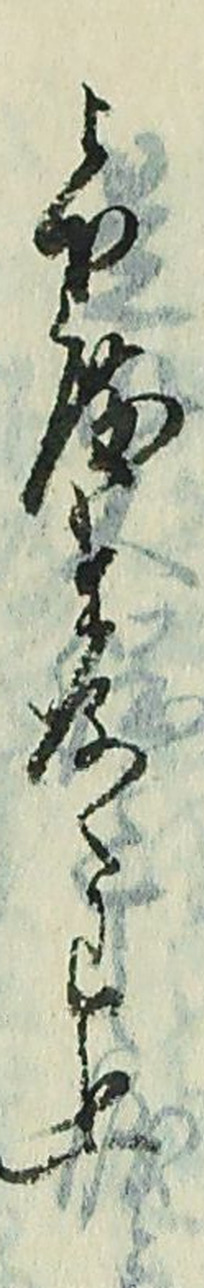被下度奉存候已上
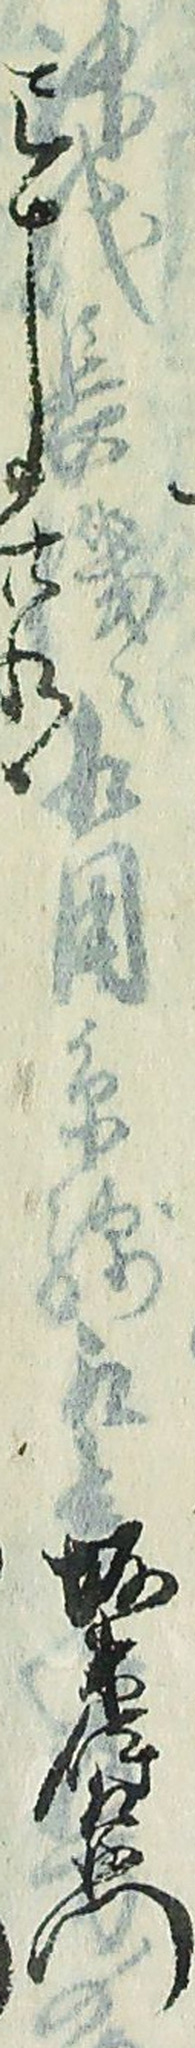巳十月廿九日坂本伊左衛門
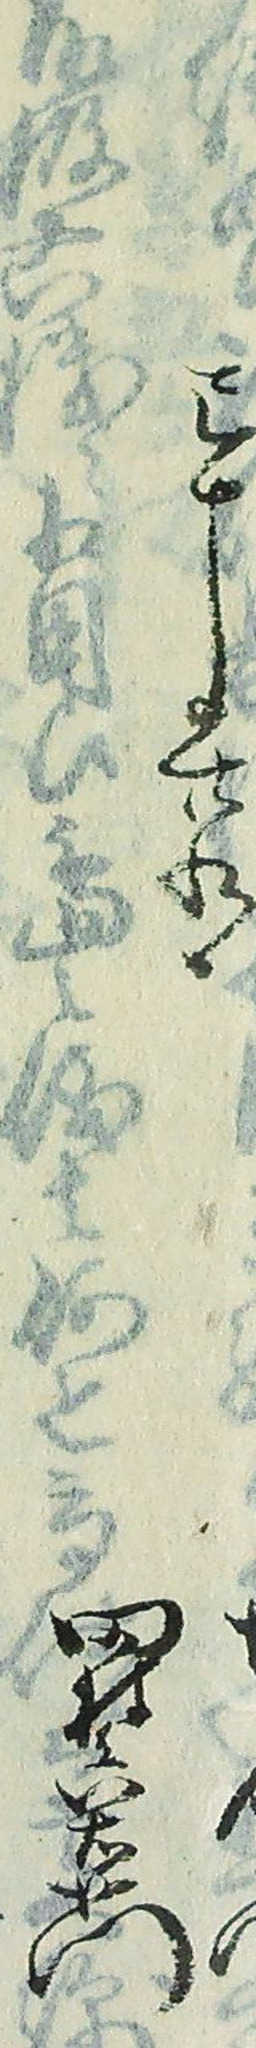田村真右衛門
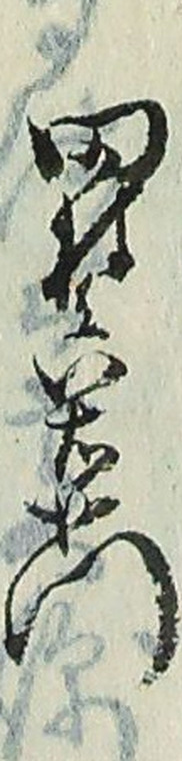田村真右衛門
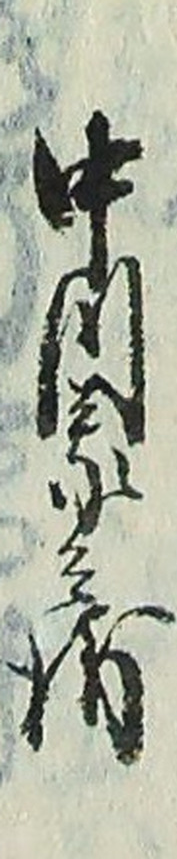中川義兵衛
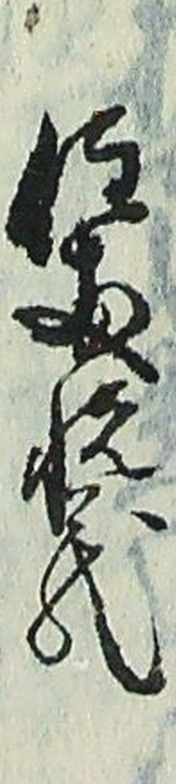住友悦蔵
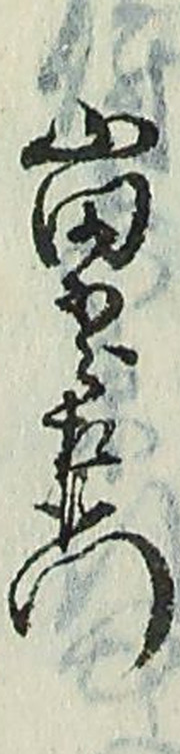山田五郎左衛門
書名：油稼御取究ニ附御箇條書テ以被仰渡南北同役申談御答書控
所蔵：鳴門教育大学 Naruto University of Education
